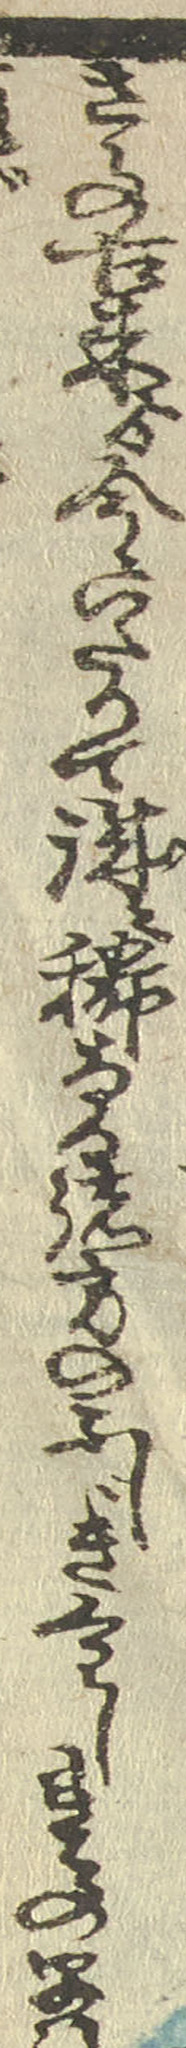き事古来ゟ今ニいたりて誠ニ稀なる諸方のふしぎくわしきことの早引
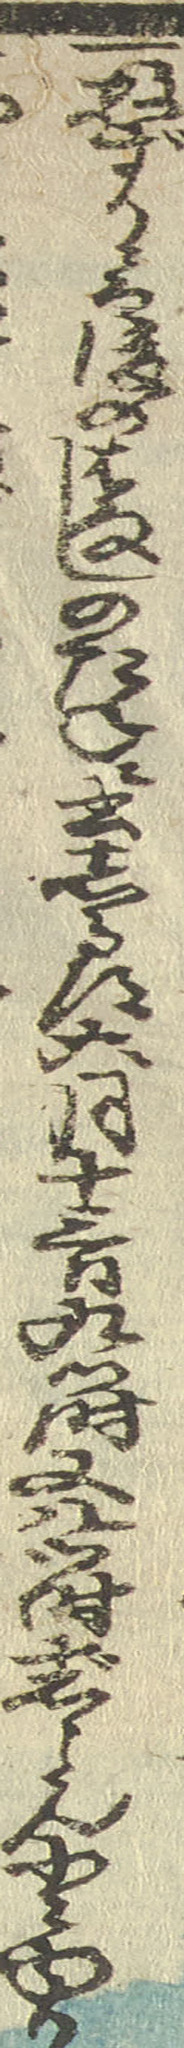一枚ずりニ而後のはなしのたねニ書しるす六月十三日九ツ時又八ツ時じしん少〻ゆり
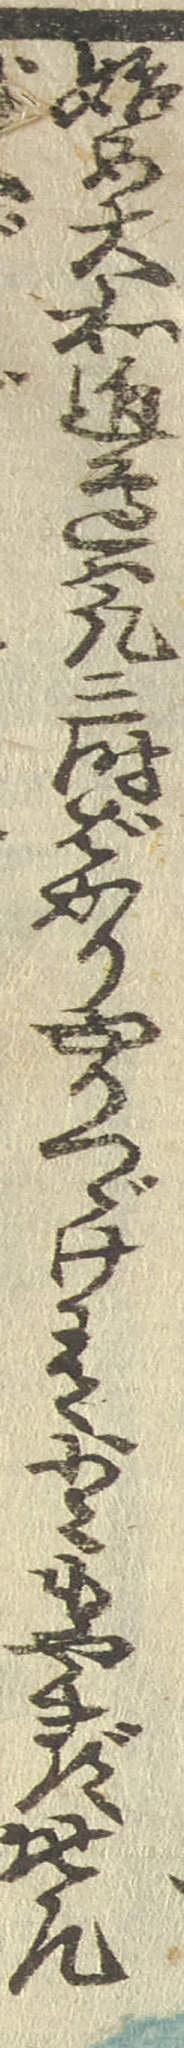始め大和近辺ハ凡三時ばかりゆりつゞけにて少〻もやまず地凡
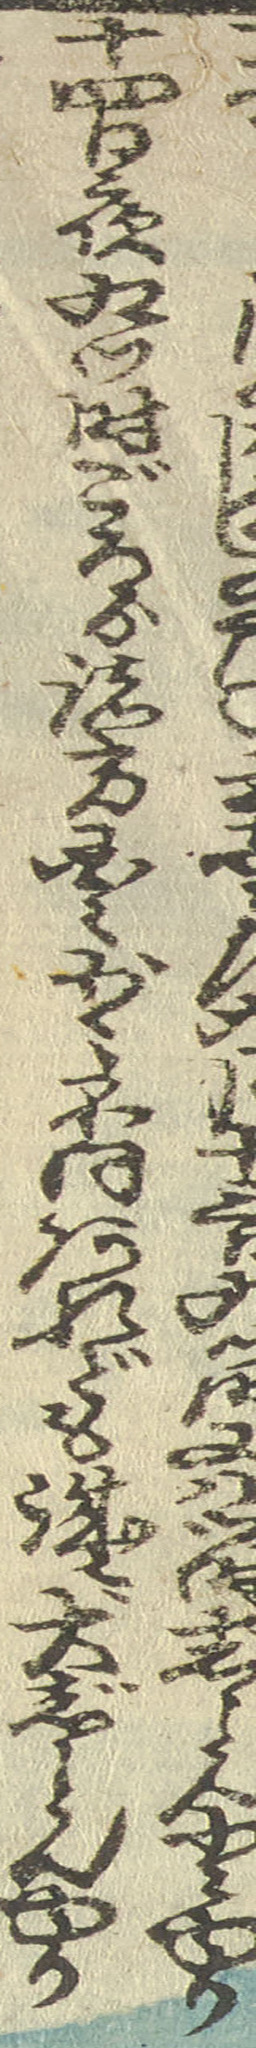十四日夜九ツ時ごろゟ諸方国〻少〻不同あれども誠ニ大じしんゆり
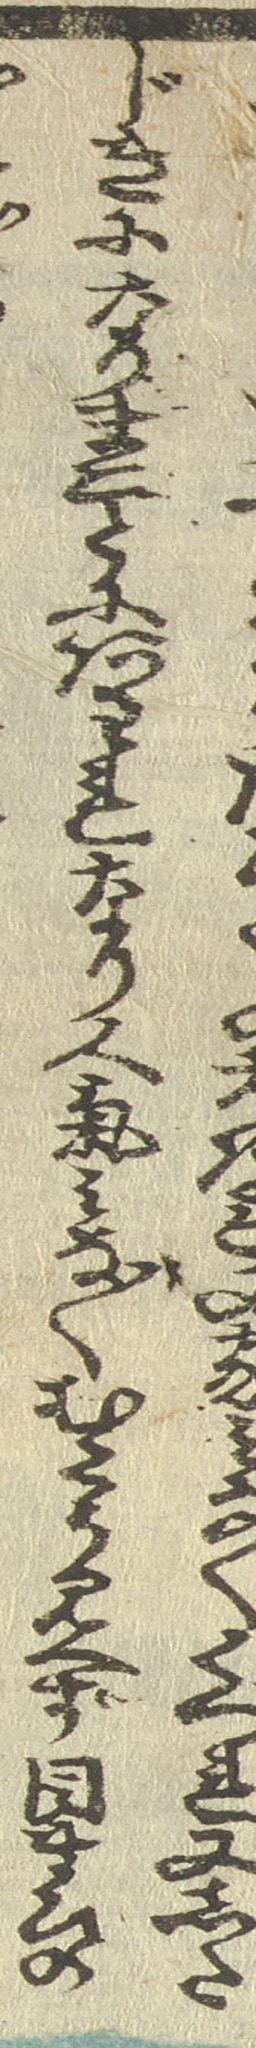じきになりまことにあわれなり人氣ミな〳〵むこう見へず目まひの
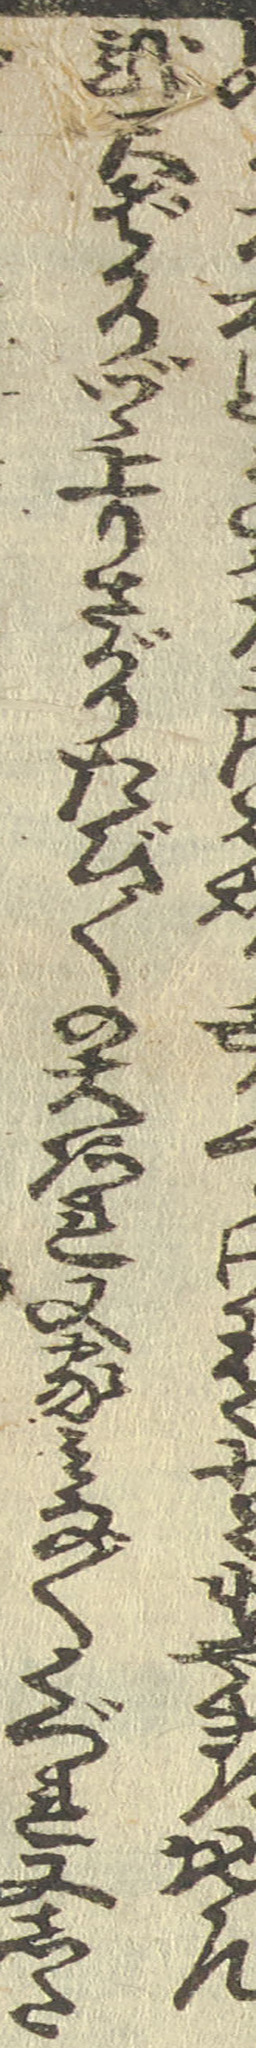弐尺ばかりヅヽ上りさがりたび〳〵の大あれ又家ミな〳〵くづれ又した
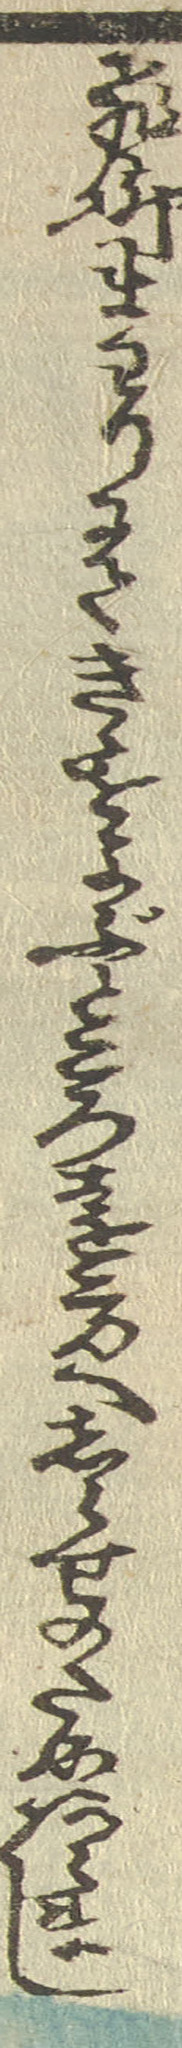飛脚まわりにてきゝをよぶところ遠方へしらせのためあらまし
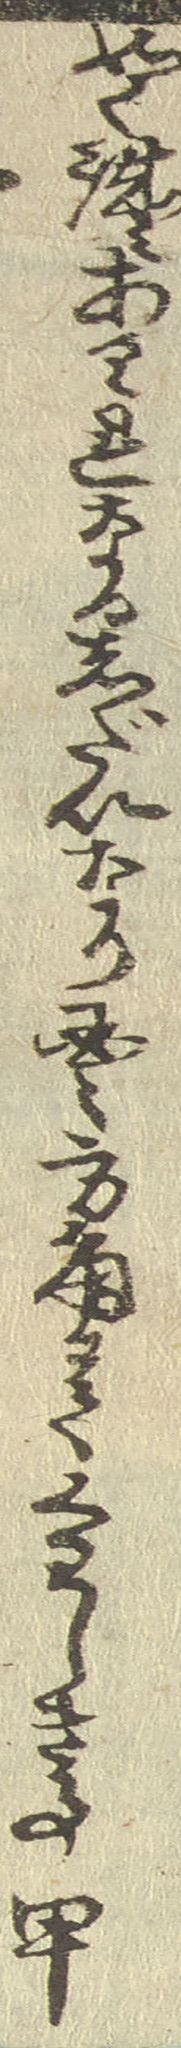如く誠ニあわれなるしだいなり国〻方角にてくわしき事早
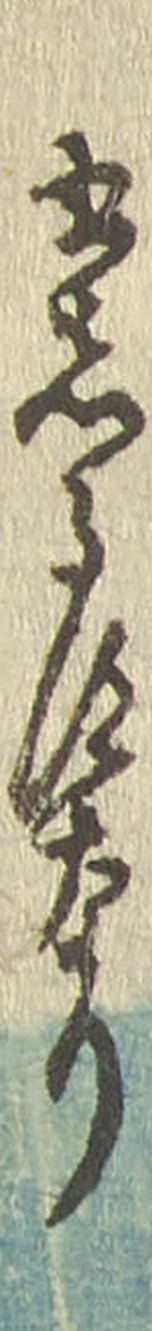書しるすなり

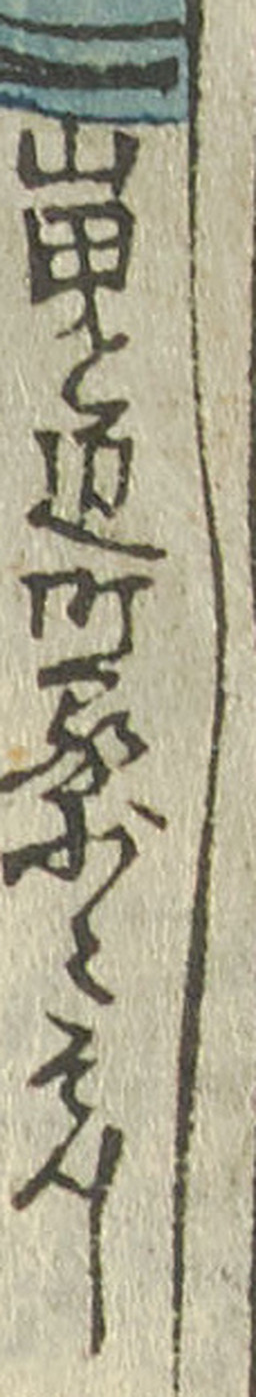山田近辺町家少々そんし
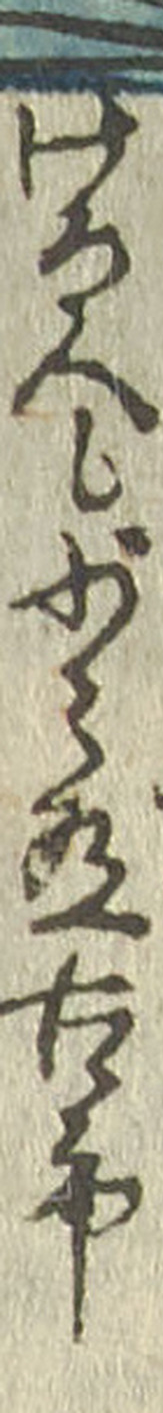けか人も少々有古市
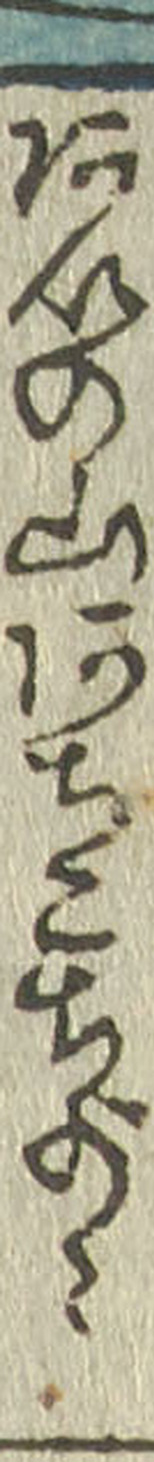あいの山あちこち少々
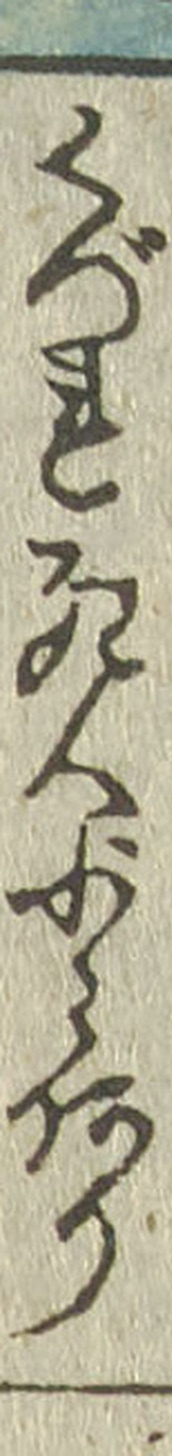くづれ死人少々あり
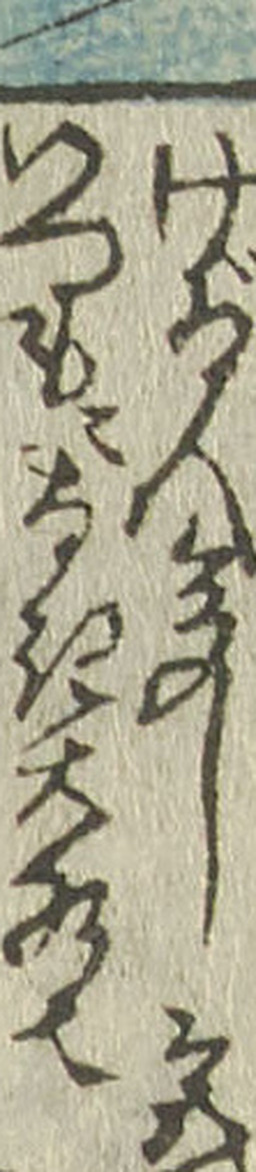いつもになき大水也
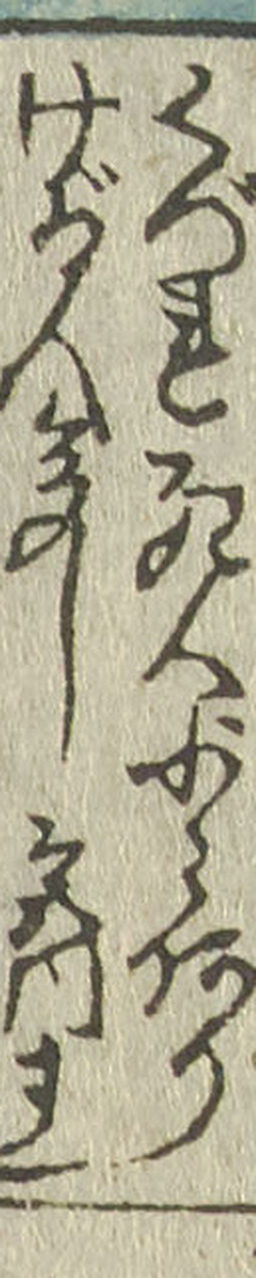けが人多し宮内すし
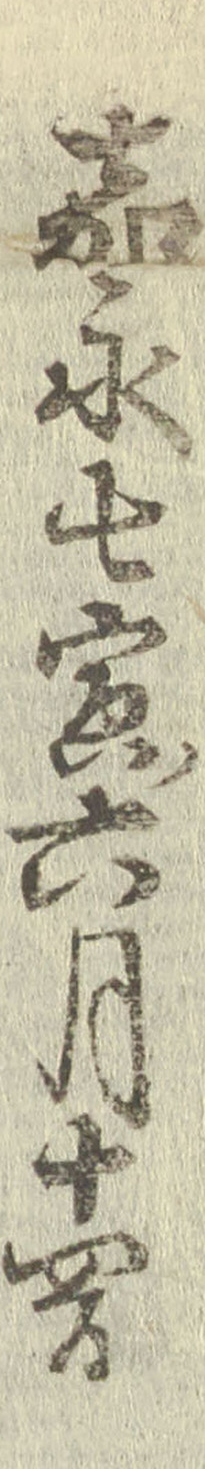嘉永七寅六月十四日
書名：大地震早引方角附
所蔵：東京大学総合図書館 General Library in the University of Tokyo, JAPAN
